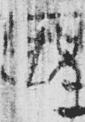聖（聼）
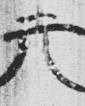亓
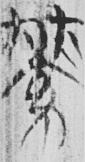縈（營）
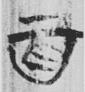百
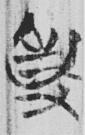事
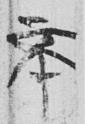不
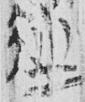述（遂）
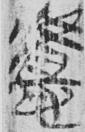○（慮）
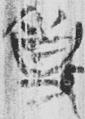事
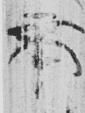不
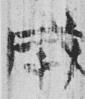成
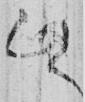○（仰）
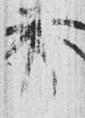天
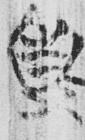事
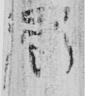君
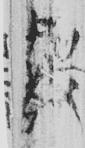○（嚴）
